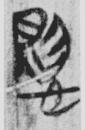惻（賊）
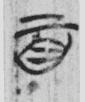百
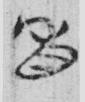眚（姓）
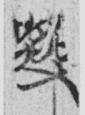○（亂）
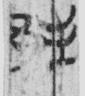邦
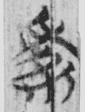○（家）
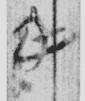○（家）
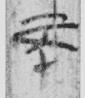不
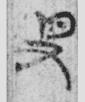○（沒）
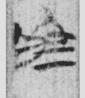爲
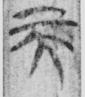天
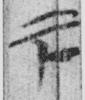下
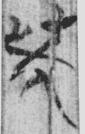笑
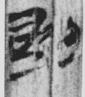則
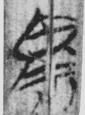{示鬼}（鬼）
